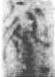紃
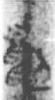○（貂）
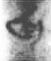首
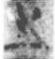之
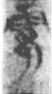○（蒙）
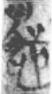○（豻）
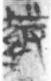○（鞁）
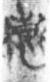○（轡）
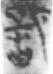敮
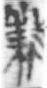兼
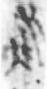炢
